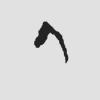人
